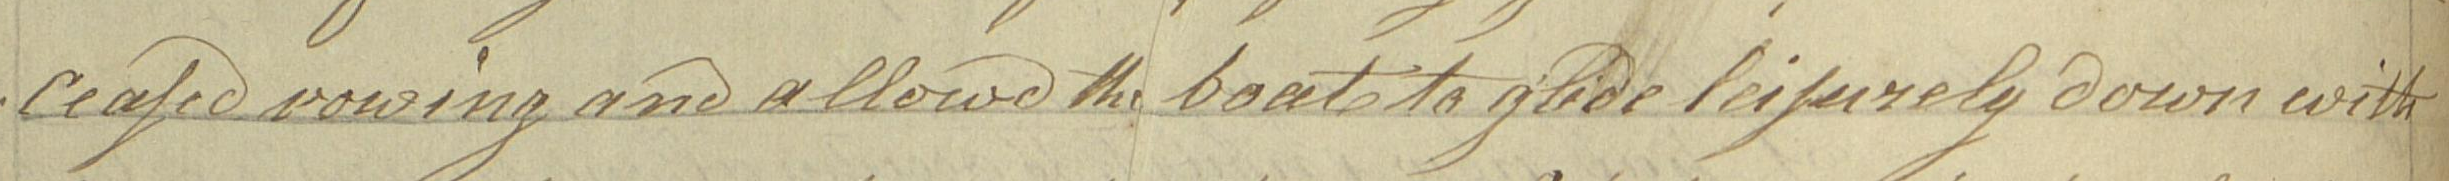ceased vowing and allowd the boat to glide leisurely down with
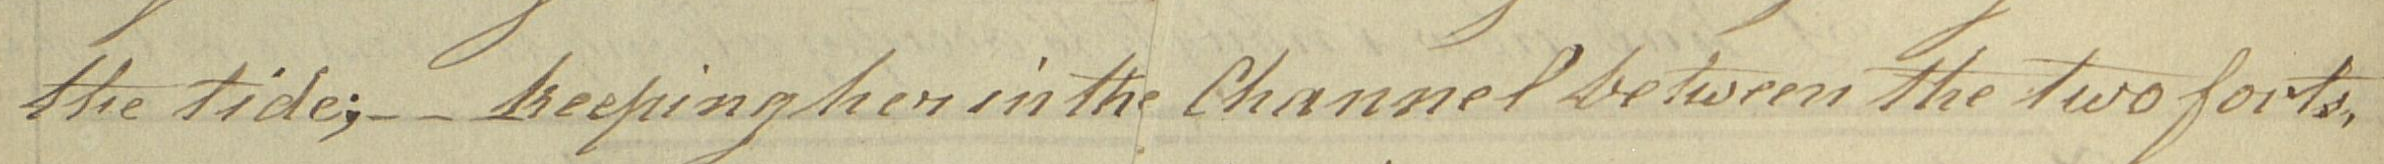the tide; keeping her in the Channel between the two forts,
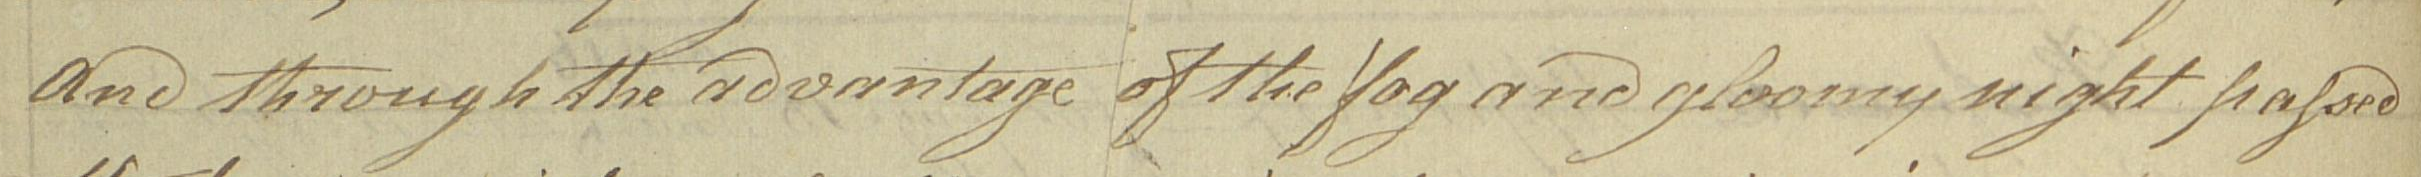and through the advantage of the fog and gloomy night passed
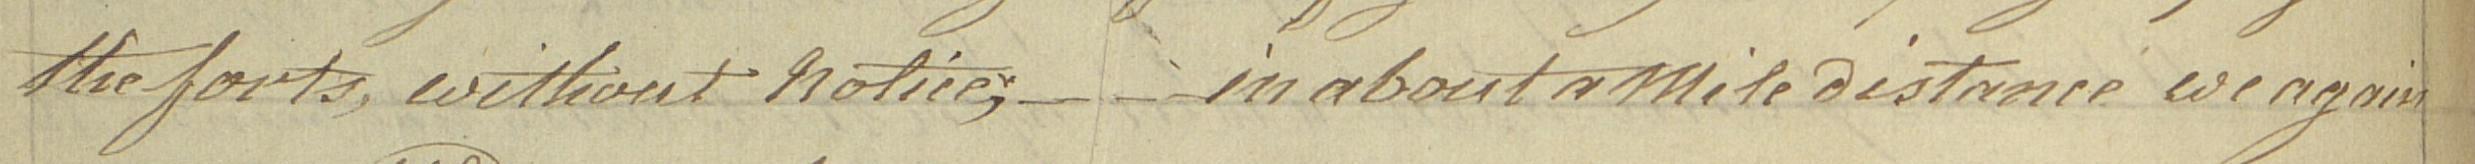the forts without Notice; in about a Mile distance we again
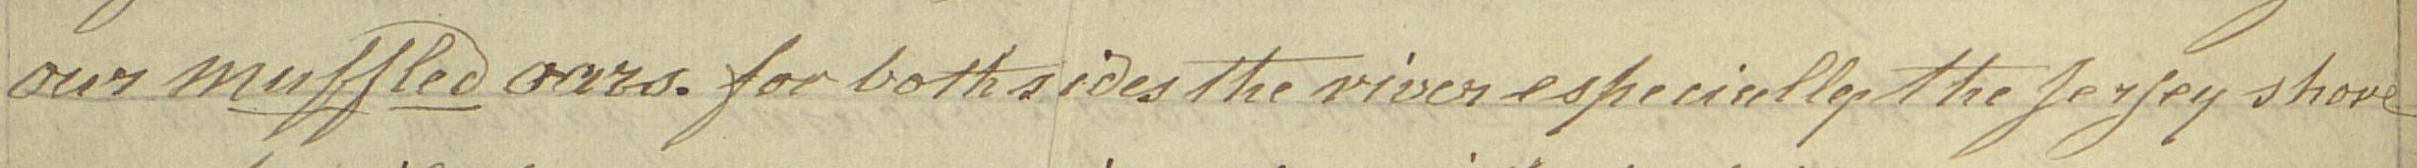our muffled oars. for both sides the river especially the Jersey shore
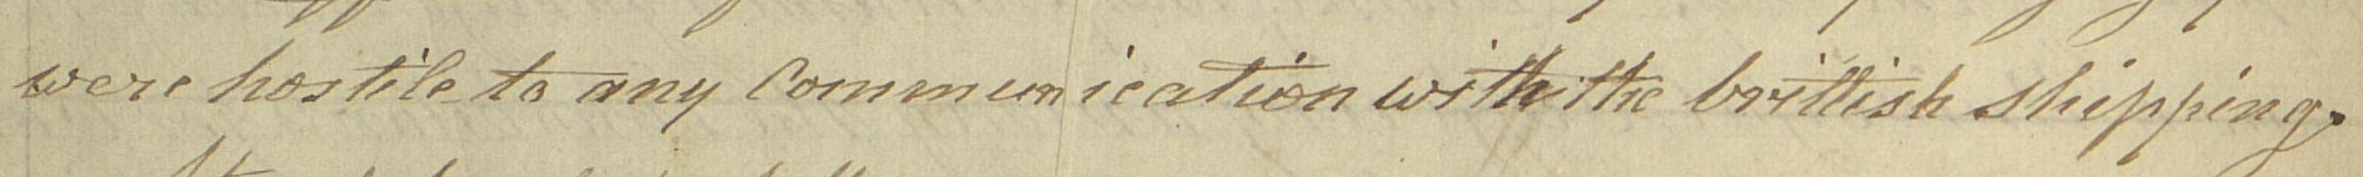were hostile to my Communication with the brittish shipping.
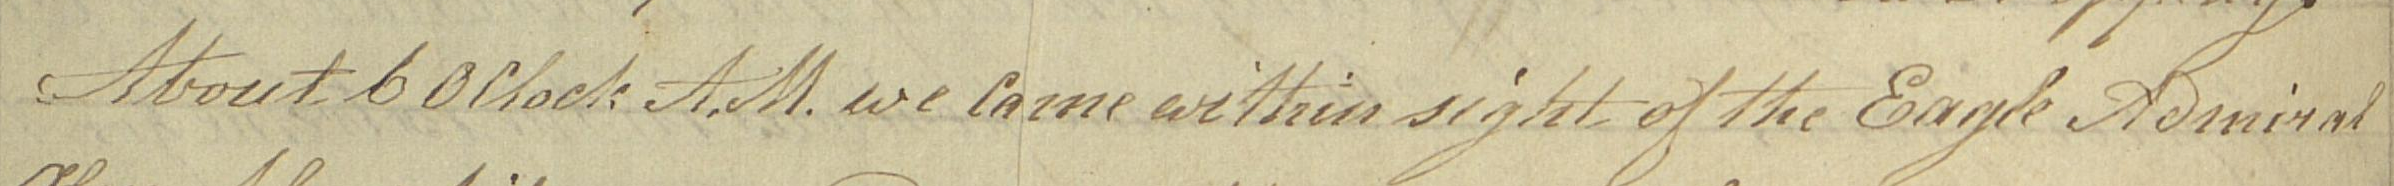About 6 OClock A.M. we came within sight of the Eagle Admiral
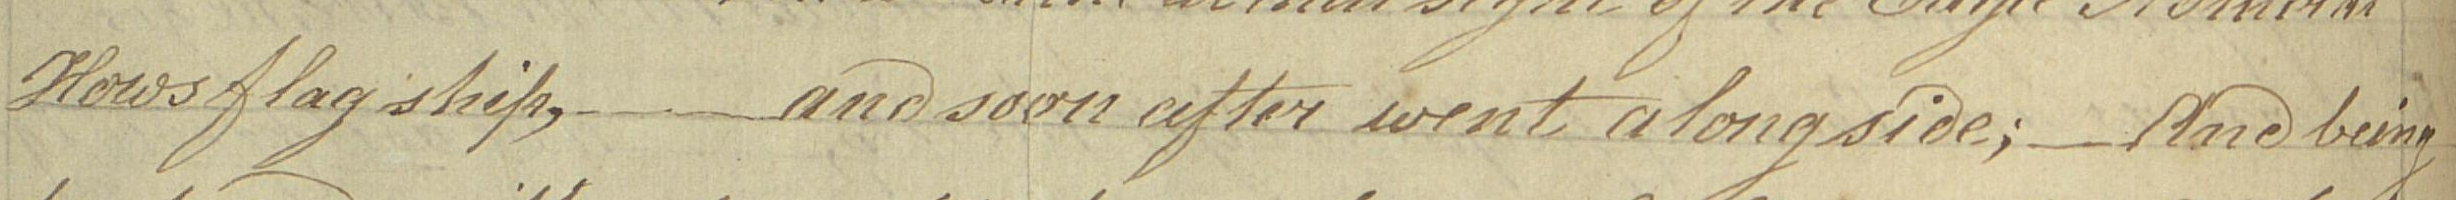Hows flagship, and soon after went alongside; And being
